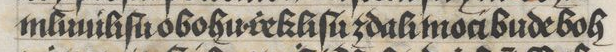mluuiliſu obohu ṙekliſu zdali moci bude boh
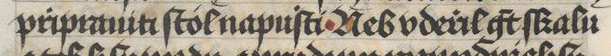pṙiprauiti ſtól napuẛti.Neb vdeṙil ḡt ſkalu
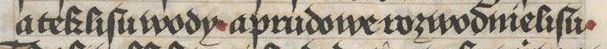a tekliſu wody.a prudowe rozwodnieliſu.
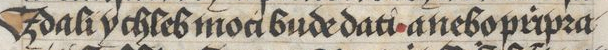Zdali y chleb moci bude dati.anebo pṙipra¬
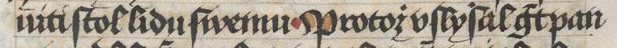uiti ſtol lidu ſwemu.Protoż vſlyẛal ḡt pan
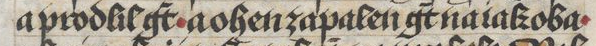a prodlil ḡt.a ohen zapalen ḡt iak oba.
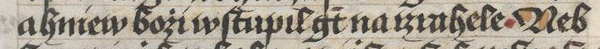a hniew bożí wſtupil ḡt na izrahele.Neb
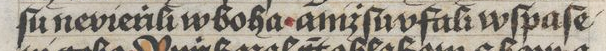ſu nevieṙili wboha.aniż ſu vfali wſpaſe¬
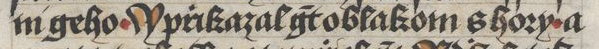ni geho.Ypṙikazal ḡt oblakom s hory.a
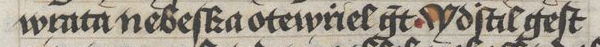wrata nebeſka otewṙiel ḡt.Ydẛtil geſt
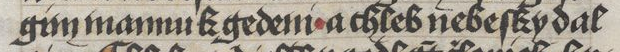gim mannu k gedení.a chleb nebeſky dal
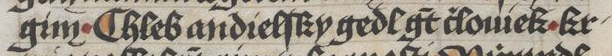gim.Chleb andielſky gedl ḡt ċlouíek.kr¬
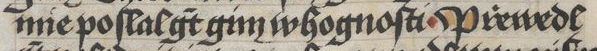mie poſlal ḡt gim whognoſti.Pṙewedl
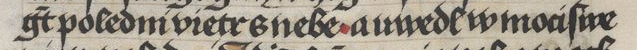ḡt poledni vietr s nebe.a uwedl w mociſwe
